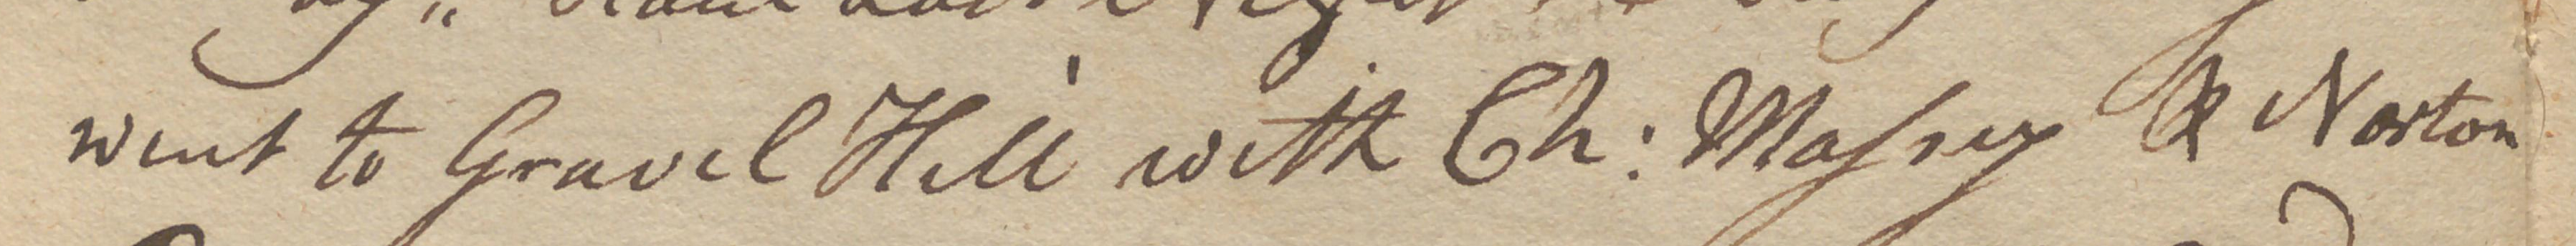went to Gravel Hill with Ch; Massey & Norton
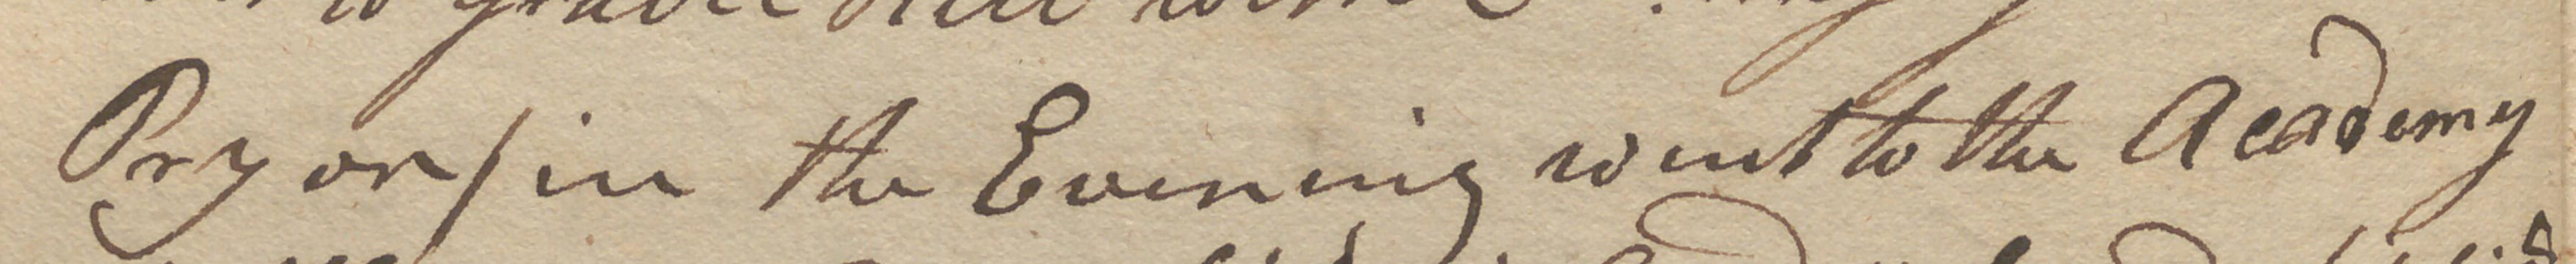Pryor / in the Evening went to the Academy
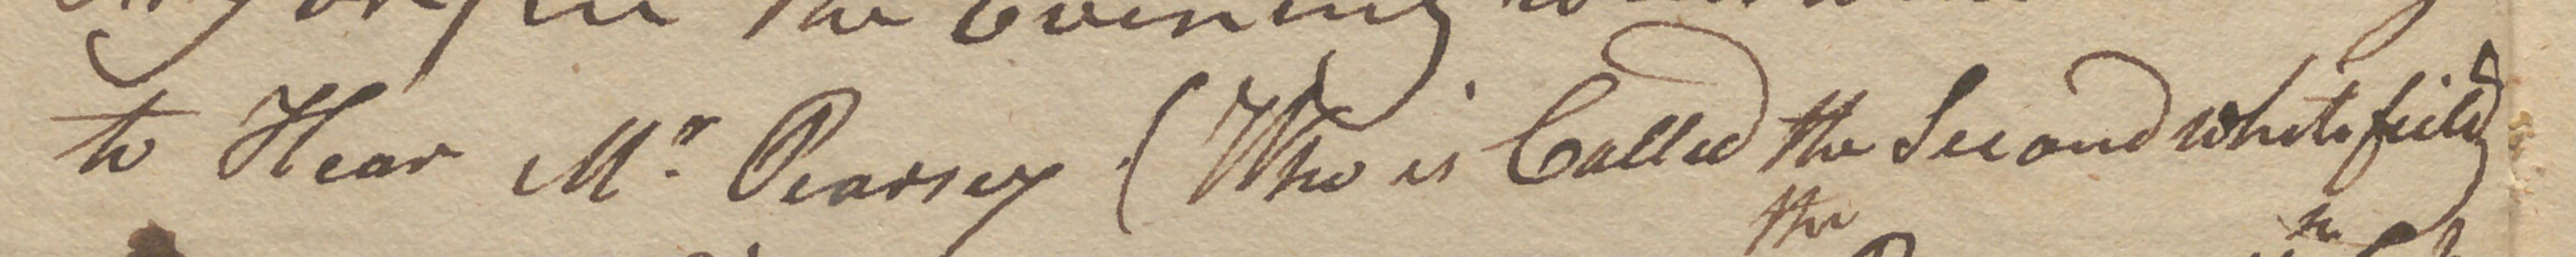to Hear M^r. Pearsey (Who is Called the Second whitefield
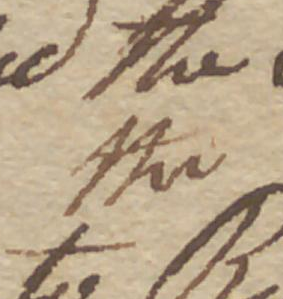the
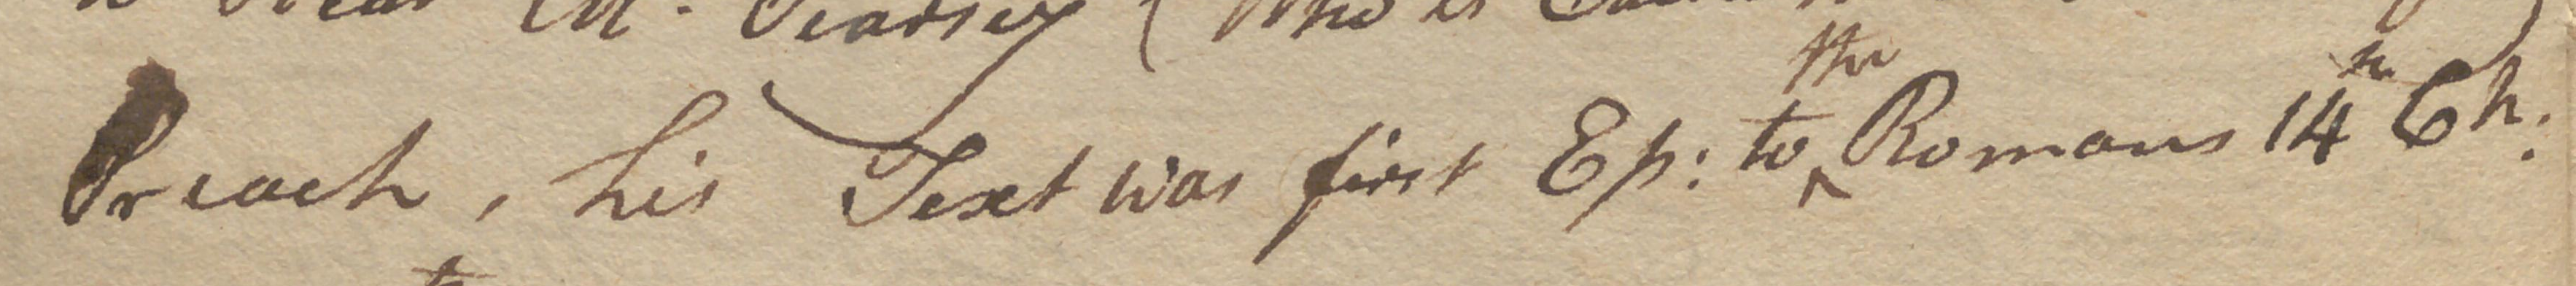Preach, his Text was first Ep: to, ^ Romans 14^t Ch
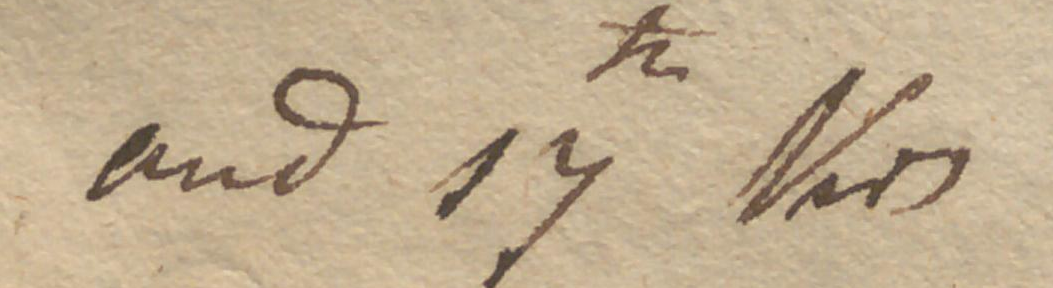and 17^th Vers
